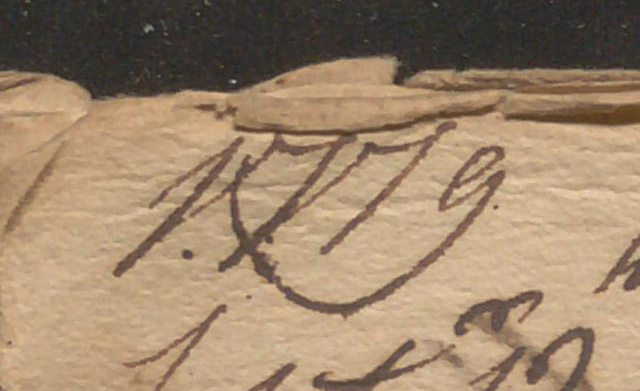1779
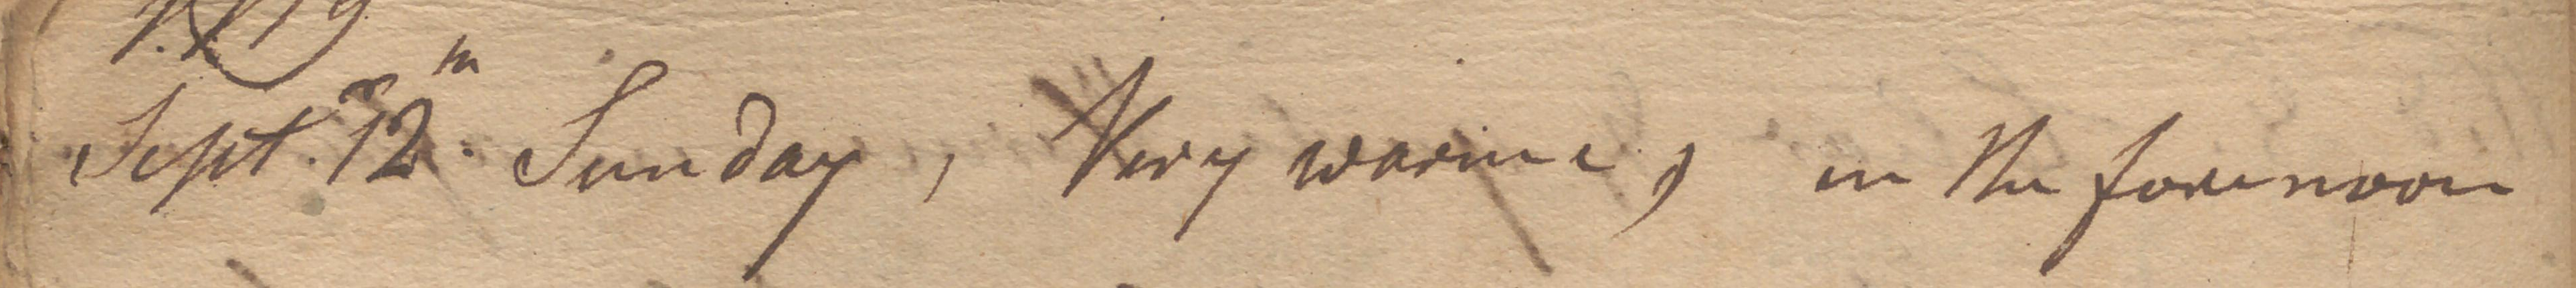Sept^r. 12^th. Sunday, Very warme, in the forenoon
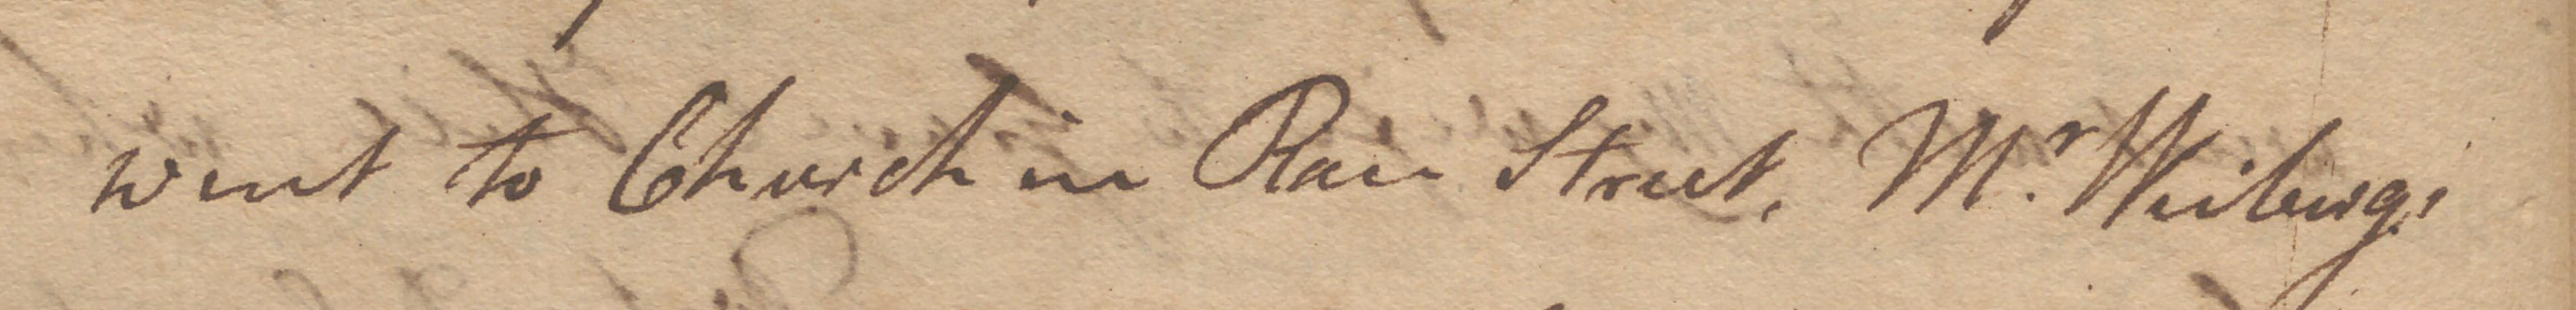went to Church in Race Street, M^r. Weiburgs
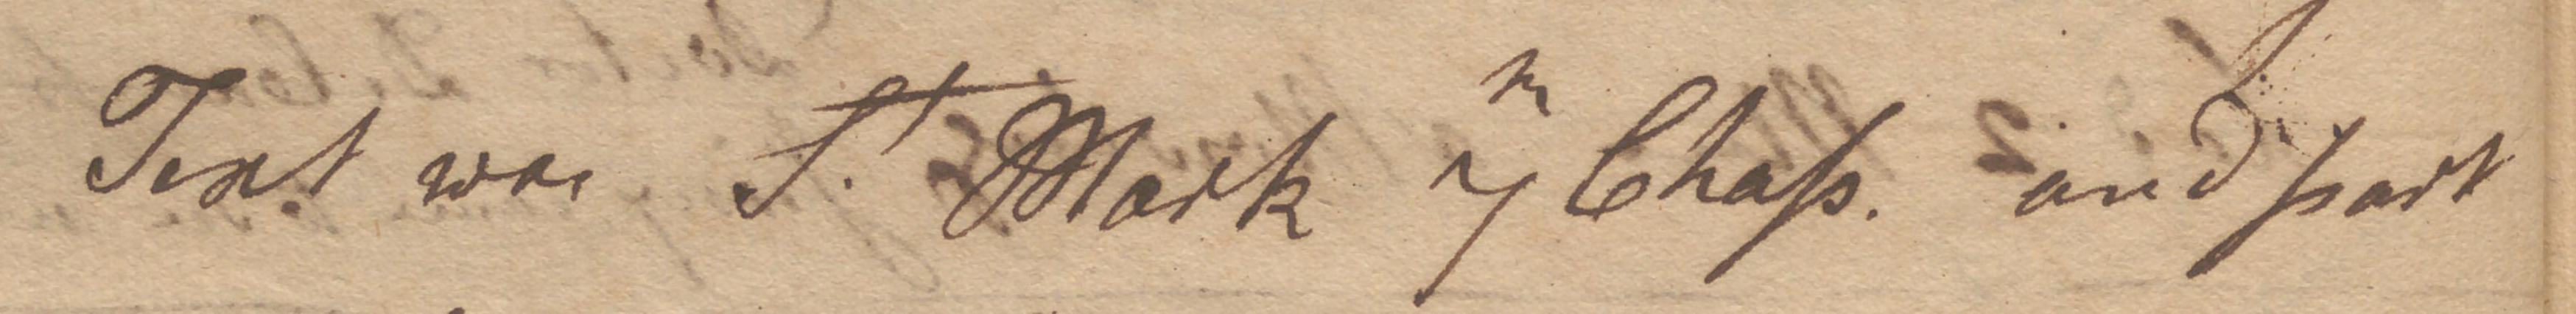Text was S^t. Mark 7^th Chap. and part
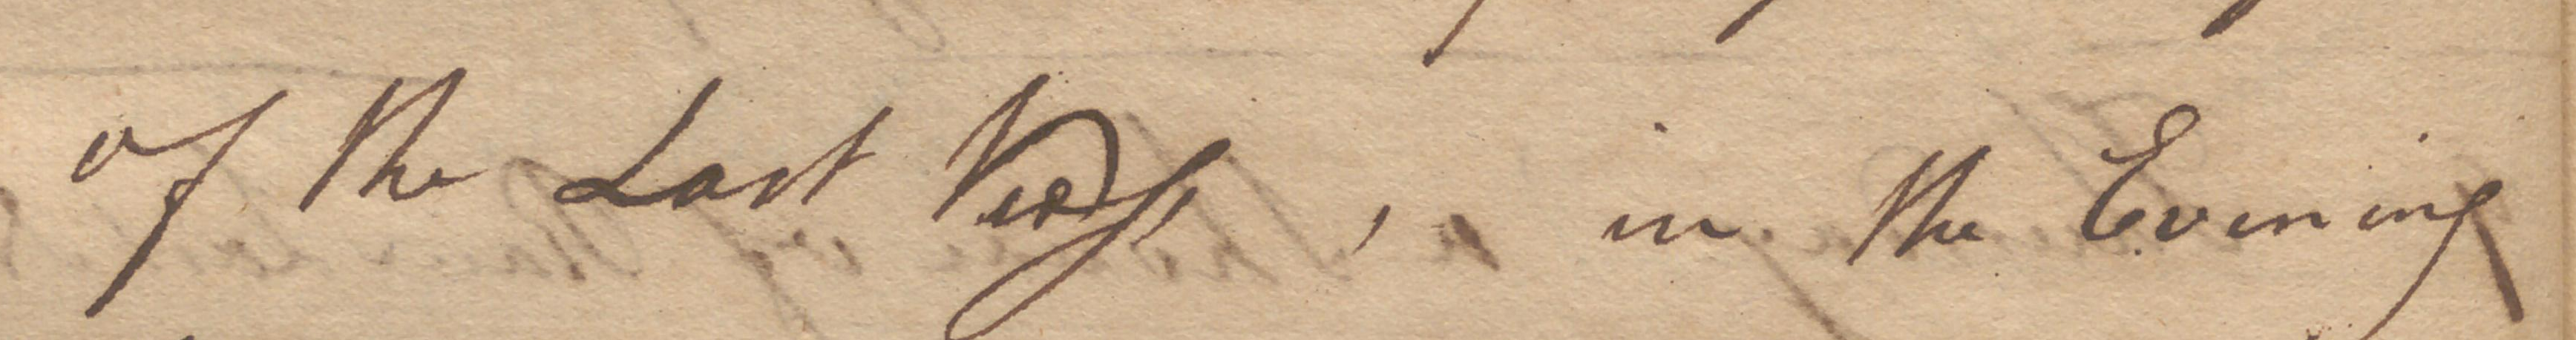of the Last Verss, in the Evening
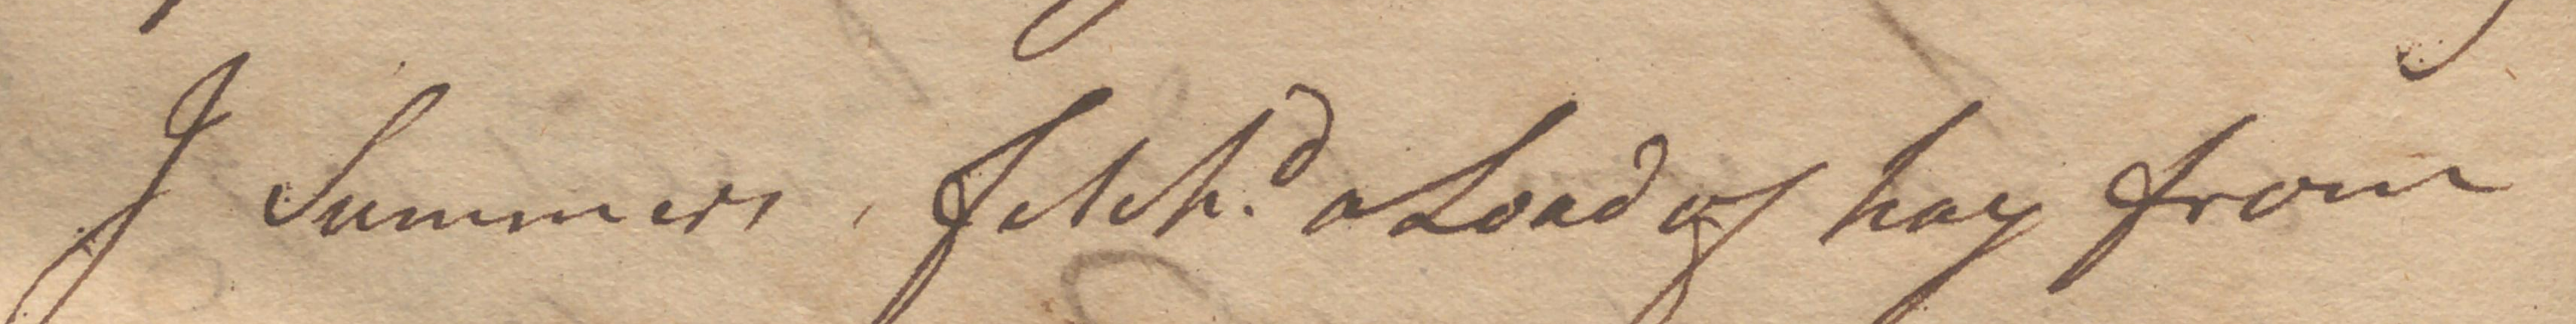J Summers, fetch^d. a Load of hay from
